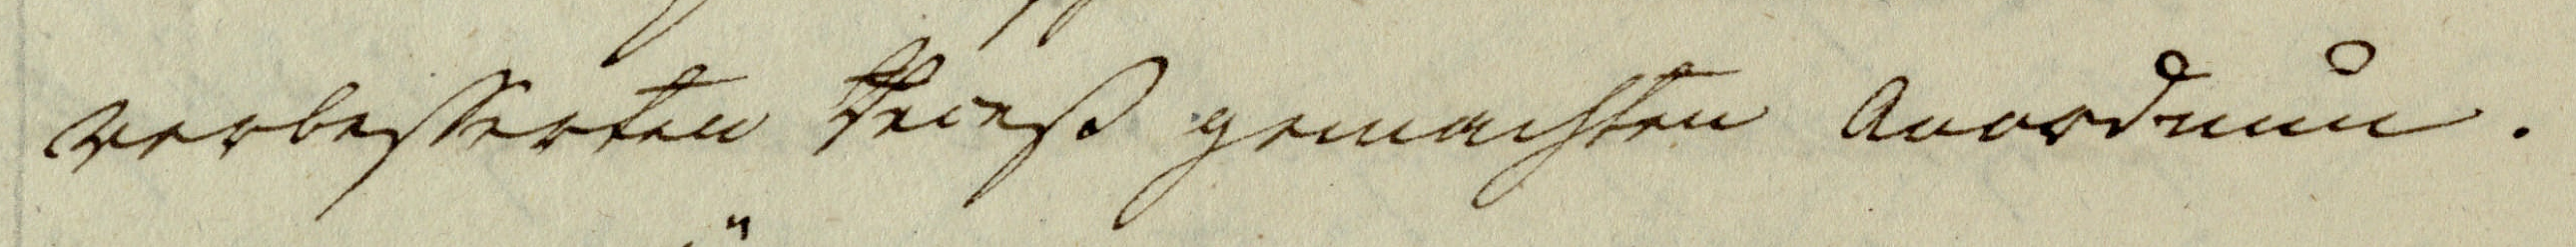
verbesserten Receß gemachten Anordnun¬
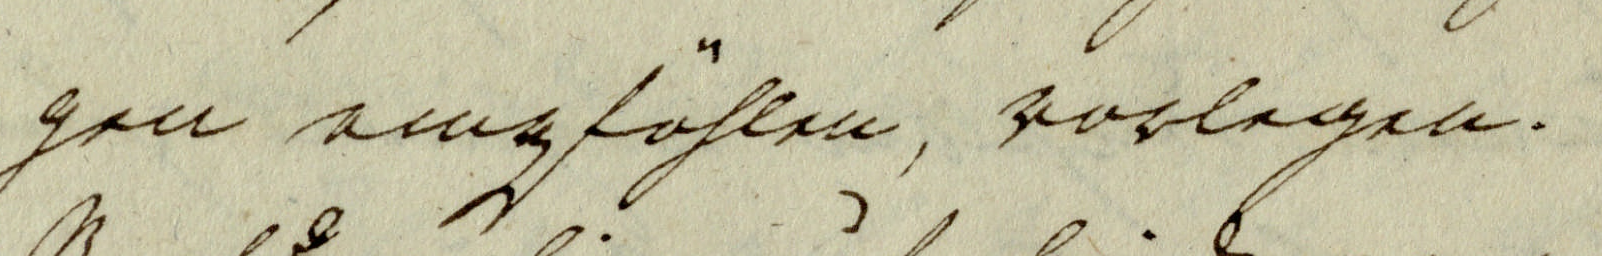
gen empföhlen, vorlegen.
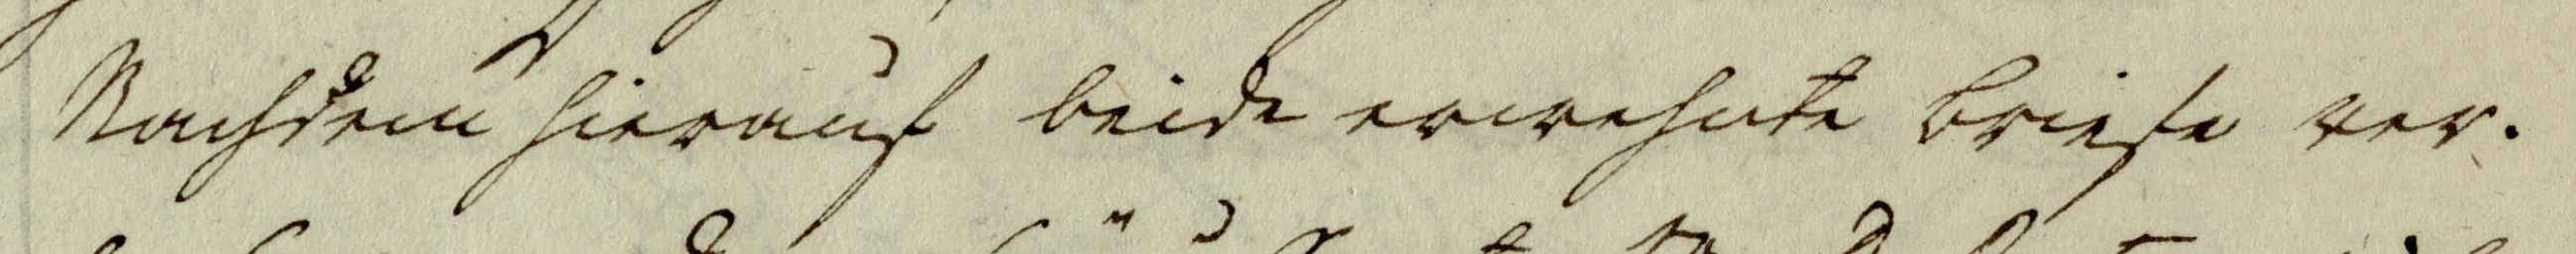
Nachdem hierauf beide erwehnte Briefe ver¬
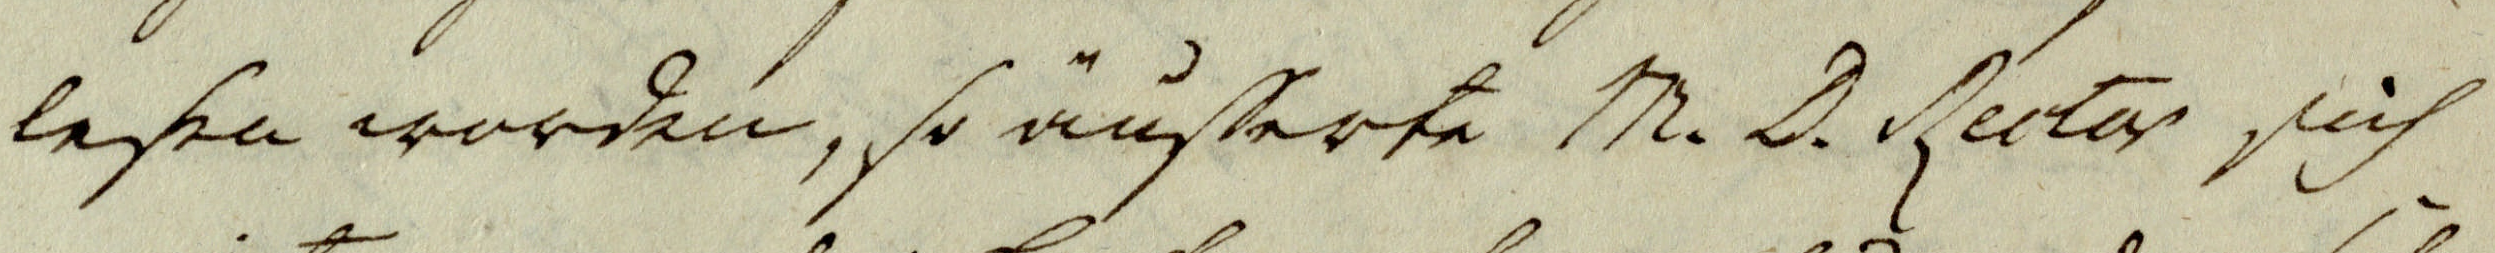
lesen worden, so äusserte M. D. Rector sich
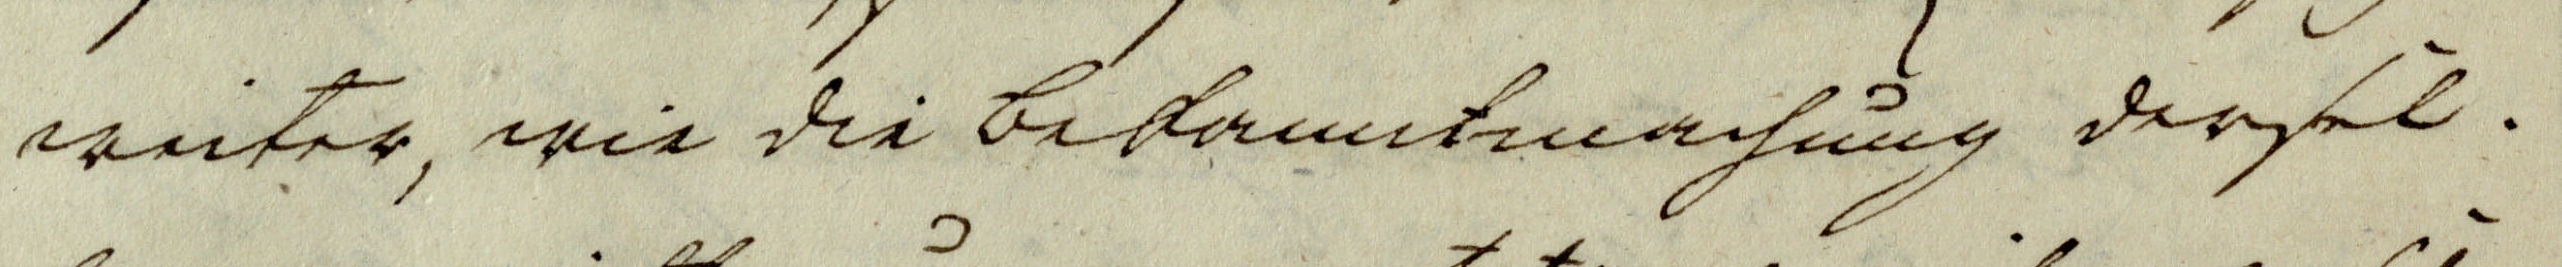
weiter, wie die Bekanntmachung dersel¬
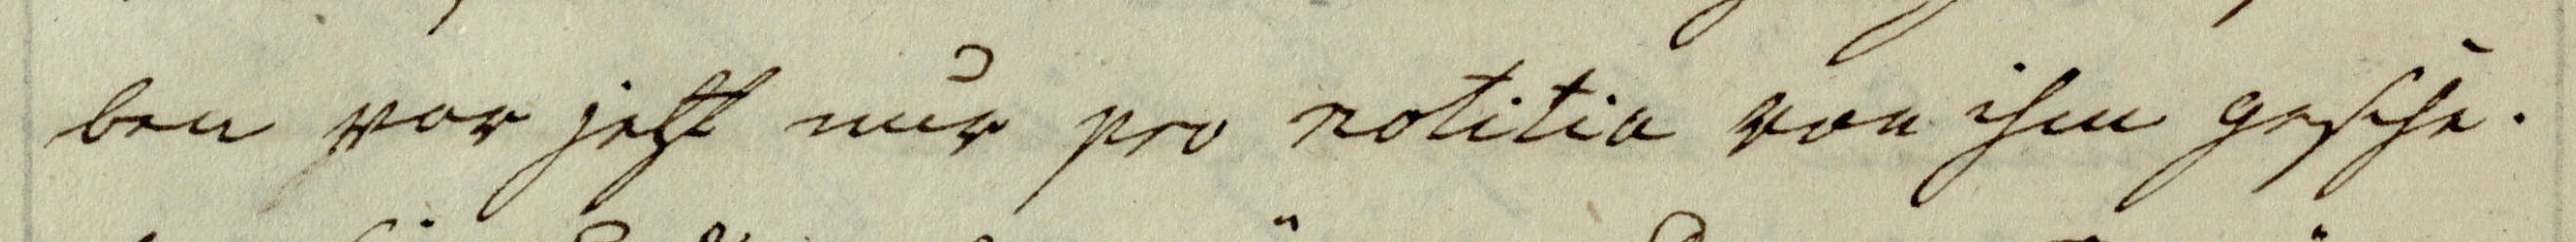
ben vor jetzt nur pro notitia von ihm gesche¬
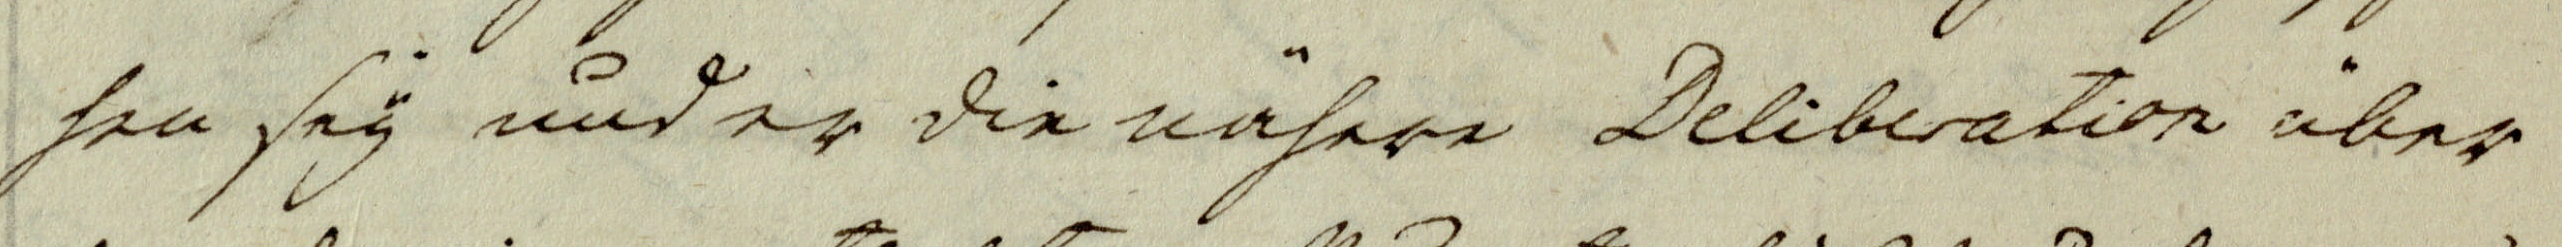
hen seÿ und er die nähere Deliberation über
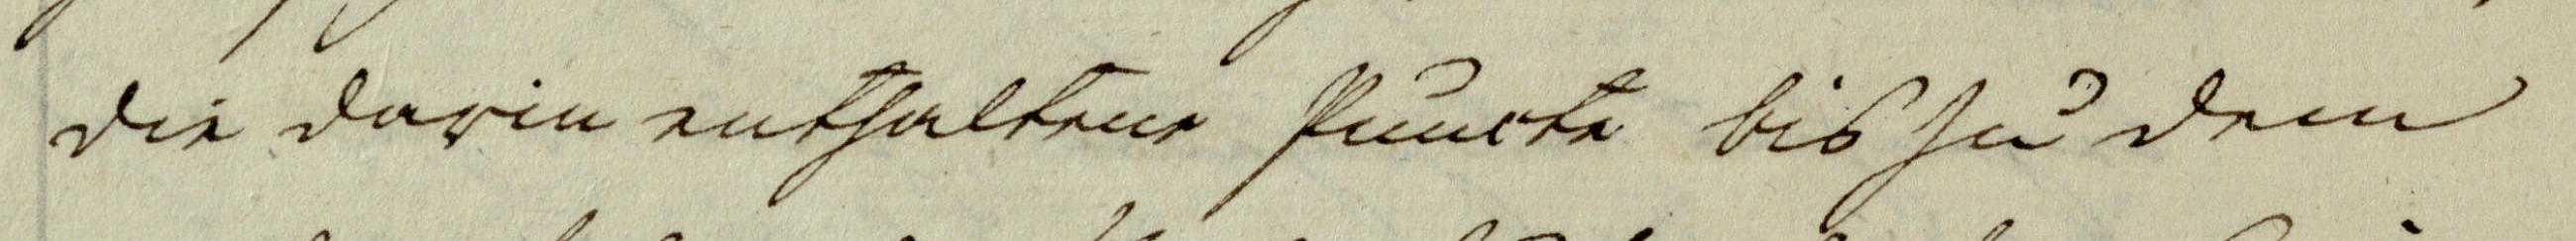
die darin enthaltene Puncte bis zu dem
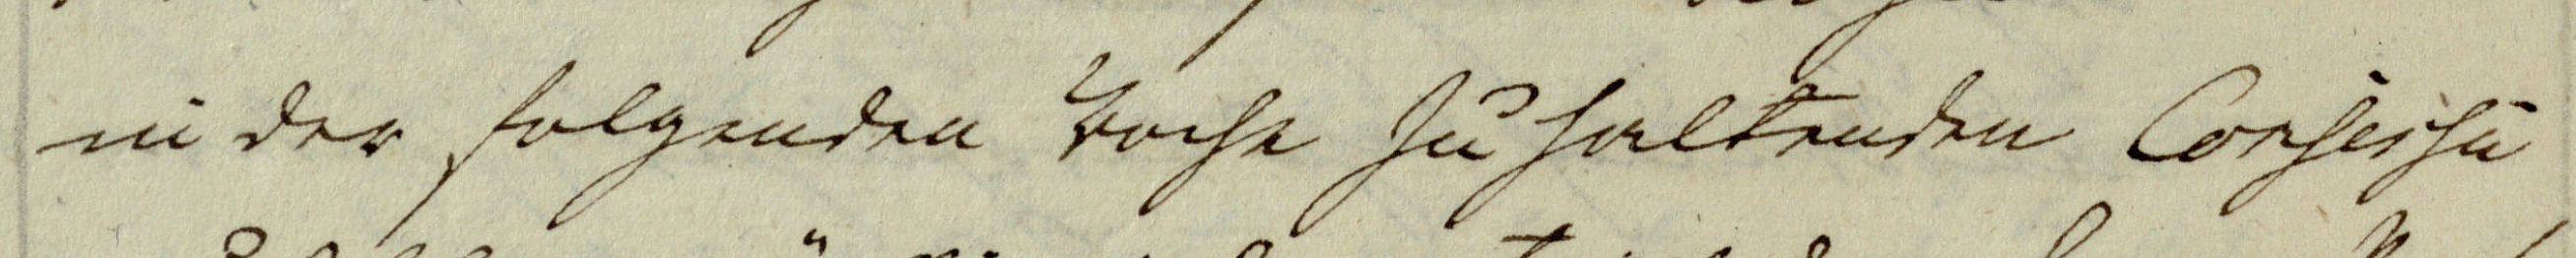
in der folgenden Woche zu haltenden Consessu
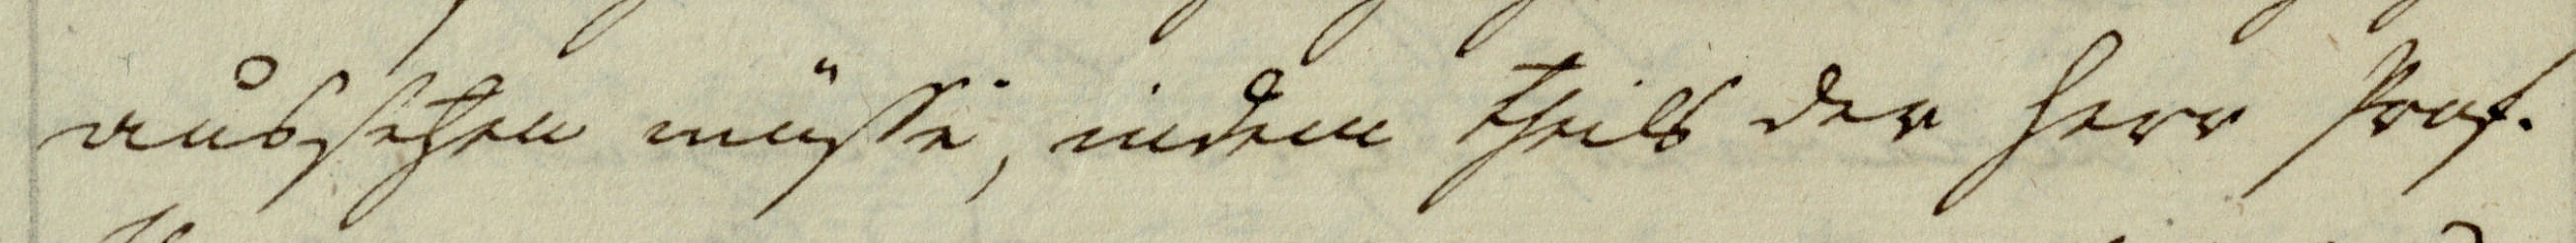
aussetzen müsse, indem theils der Herr Prof.
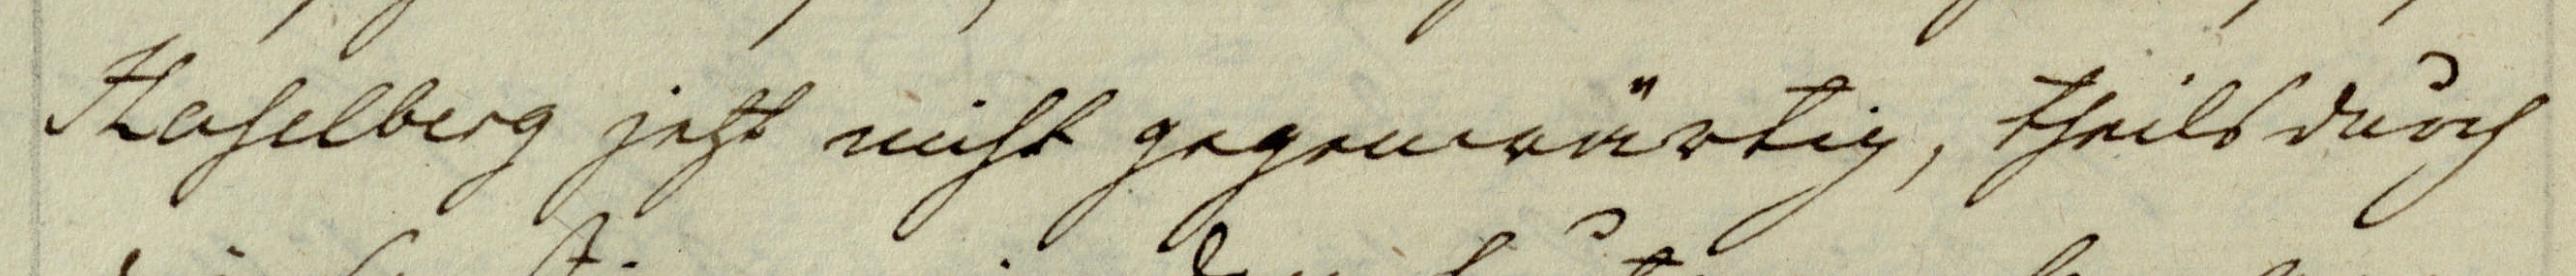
Haselberg jetzt nicht gegenwärtig, theils durch
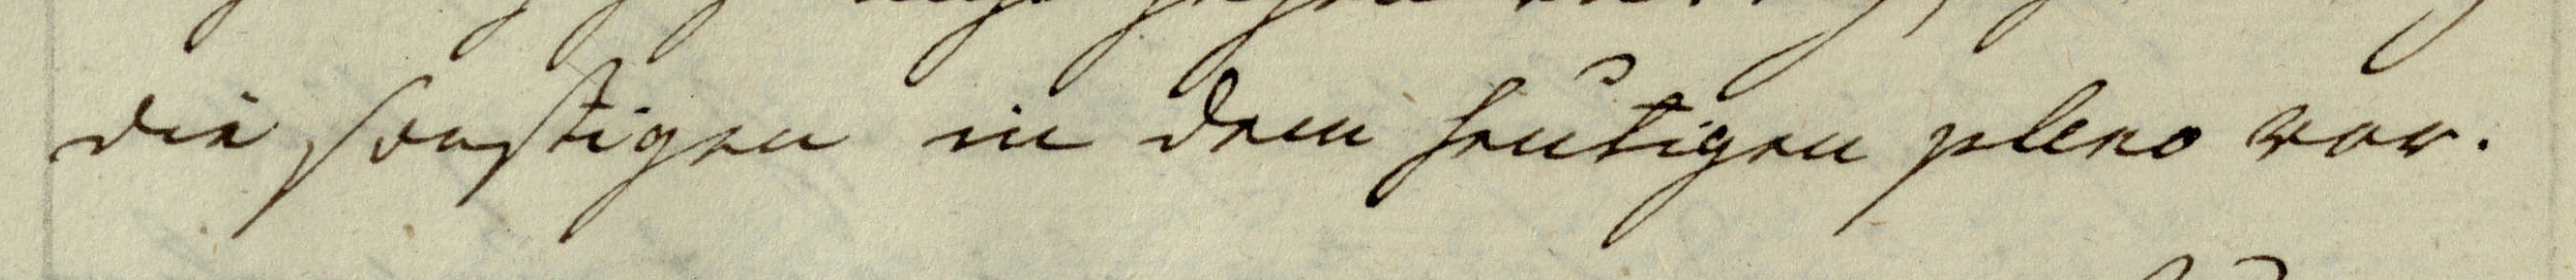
die sonstigen in dem heutigen pleno vor¬
